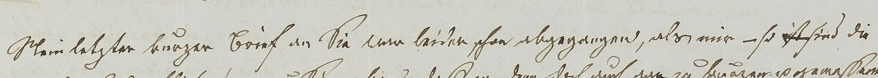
Mein letzter kurzer Brief an Sie war leider schon abgegangen, als mir – so ist sind die
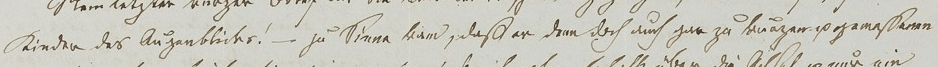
Kinder des Augenblicks! – zu Sinne kam, daß er denn doch auch zu kurzen & gemessenen
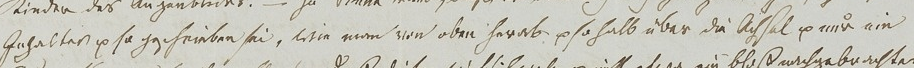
Gehaltes & so geschrieben sei, wie man von oben herab & so halb über die Achsel & nur ein
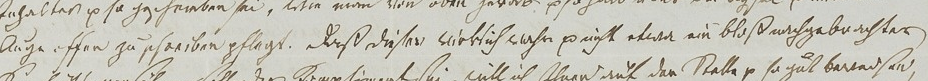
Auge offen zu schreiben pflegt. Daß dieses wirklich wahr & nicht etwa ein bloß nachgebrachtes
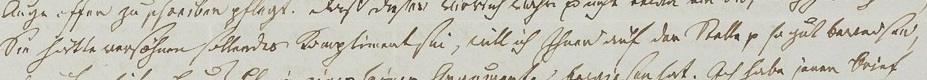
Sie hätte versöhnen sollendes Kompliment sei, will ich Ihnen auf der Stelle & so gut beweisen,
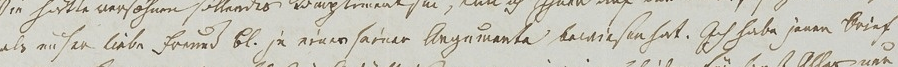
als unser liebe Freund Bl. je eines seiner Argumente bewiesen hat. Ich habe jenen Brief
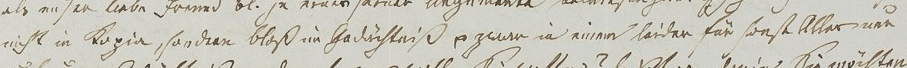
nicht in Kopia, sondern bloß im Gedächtniß & zwar in einem leider für sonst Alles nur
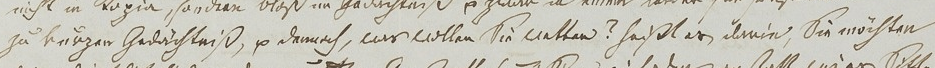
zu kurzen Gedächtniß, & dennoch, was wollen Sie wetten? heißt es darin, Sie möchten
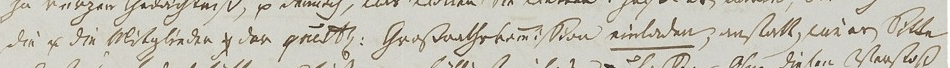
die & die Mitglieder q der quest: Großrathskommission einladen, anstatt, wie es Sitte
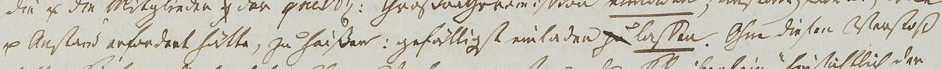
& Anstand erfordert hätte, zu heißen: gefälligst einladen zulassen. Ohne diesen Verstoß
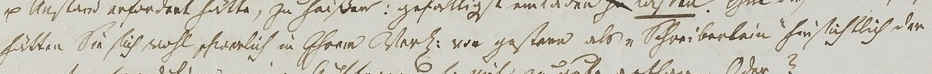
hätten Sie sich wohl schwerlich in Ihrem Verh: von gestern als «Schreiberlein» hinsichtlich der
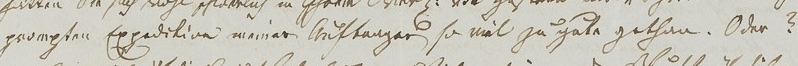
prompten Expedition meines Auftrages so viel zu gute gethan. Oder?
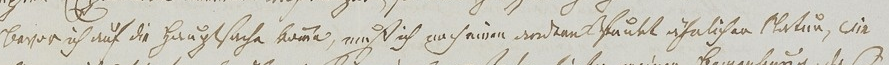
Bevor ich auf die Hauptsache komme, muß ich noch einen andern Punkt ähnlicher Natur, wie
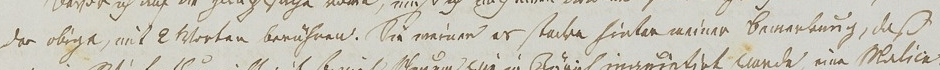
der obige, mit 2 Worten berühren. Sie meinen es stecke hinter meiner Bemerkung, daß
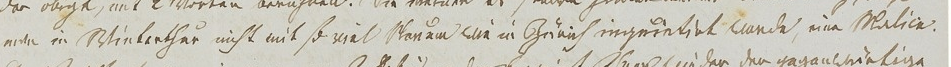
man in Winterthur nicht mit so viel Neuem wie in Zürich inquietirt werde, eine Malice.
